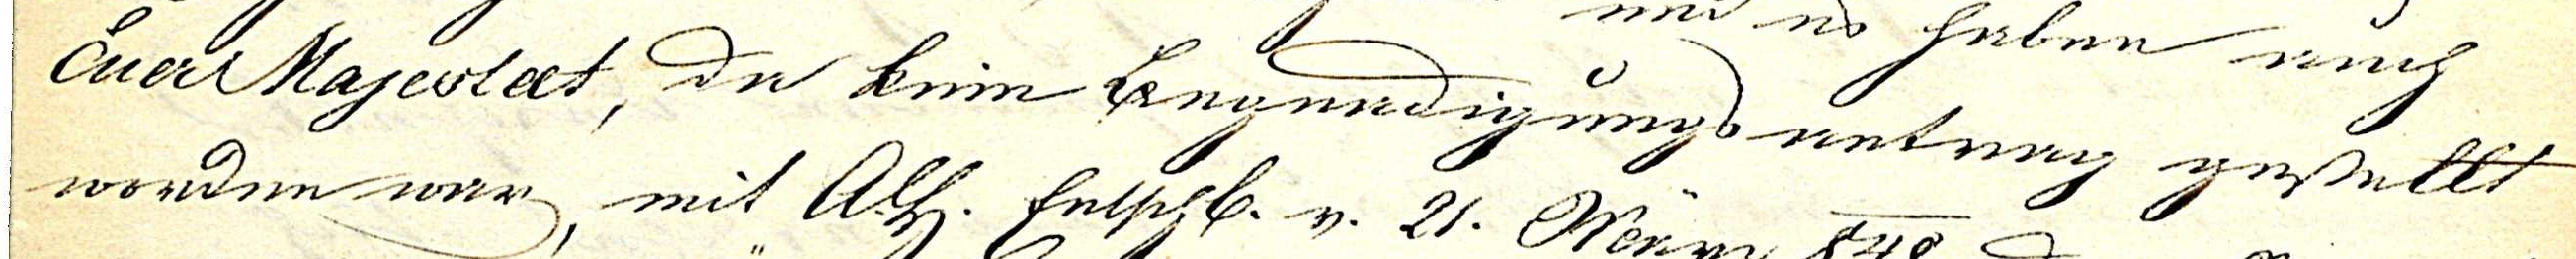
Euer Majestaet, da kein Beganigungsantrag gestellt
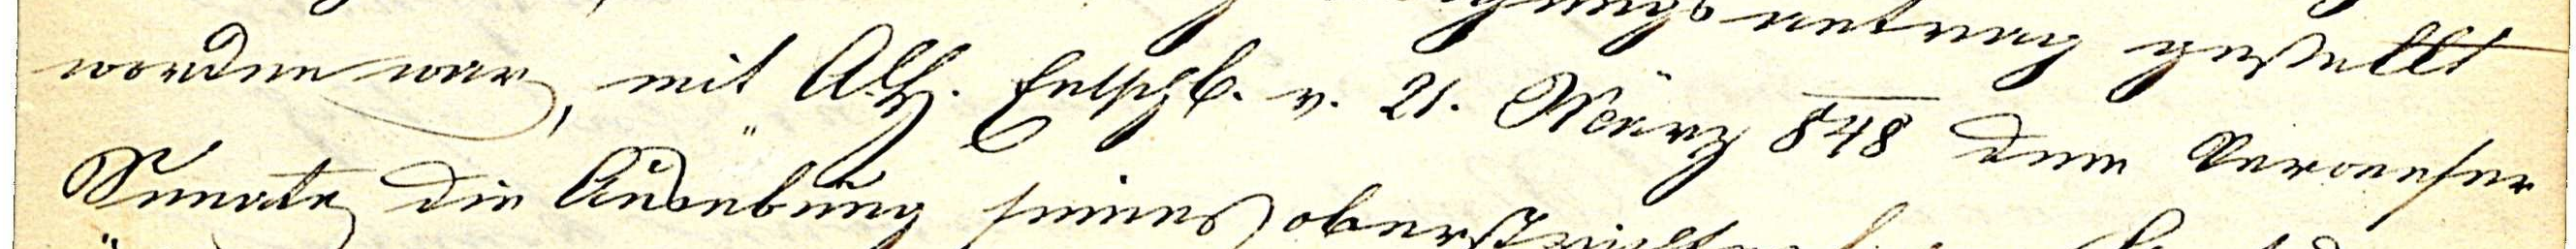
worden war, mit AlH. Entschl. v. 21. März [1]848 dem Veroneser
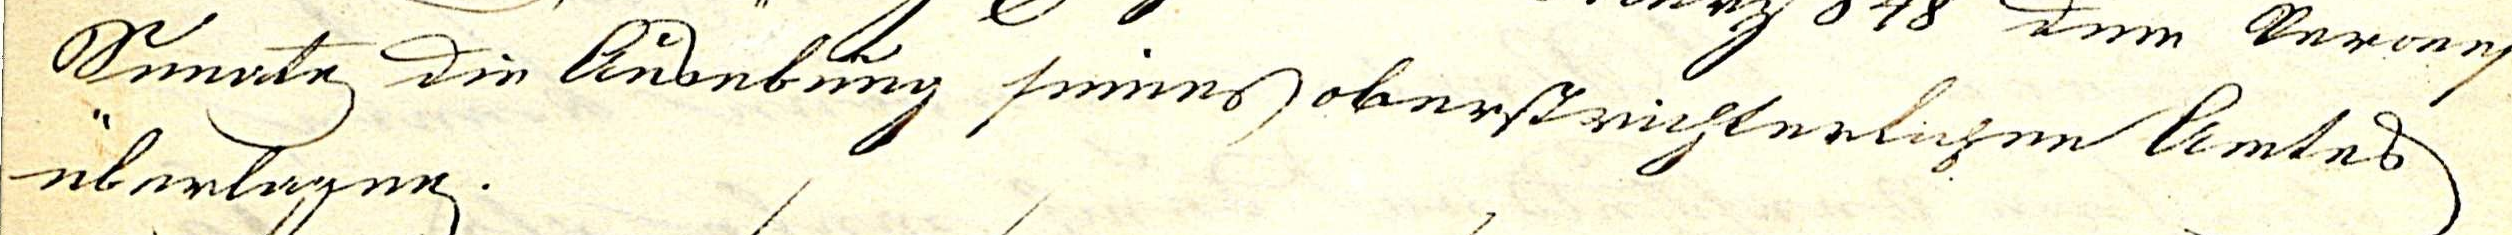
Senate die Ausübung seines oberstrichterlichen Amtes
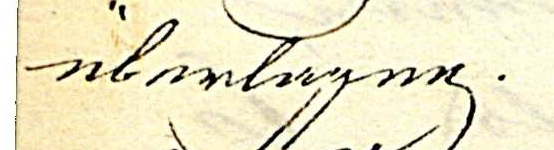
überlassen.
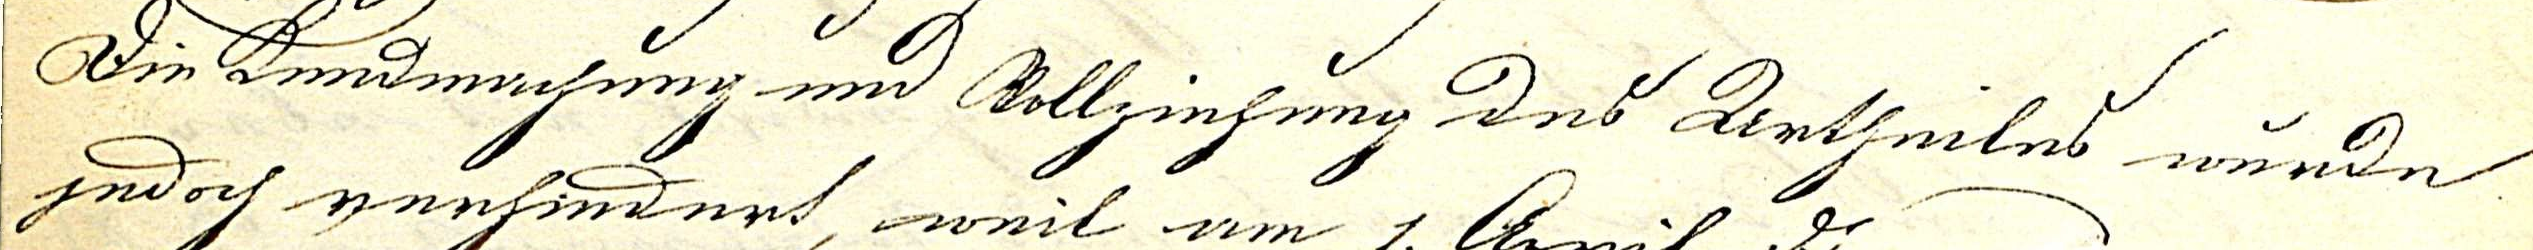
Die Kundmachung und Vollziehung des Urtheiles wurde
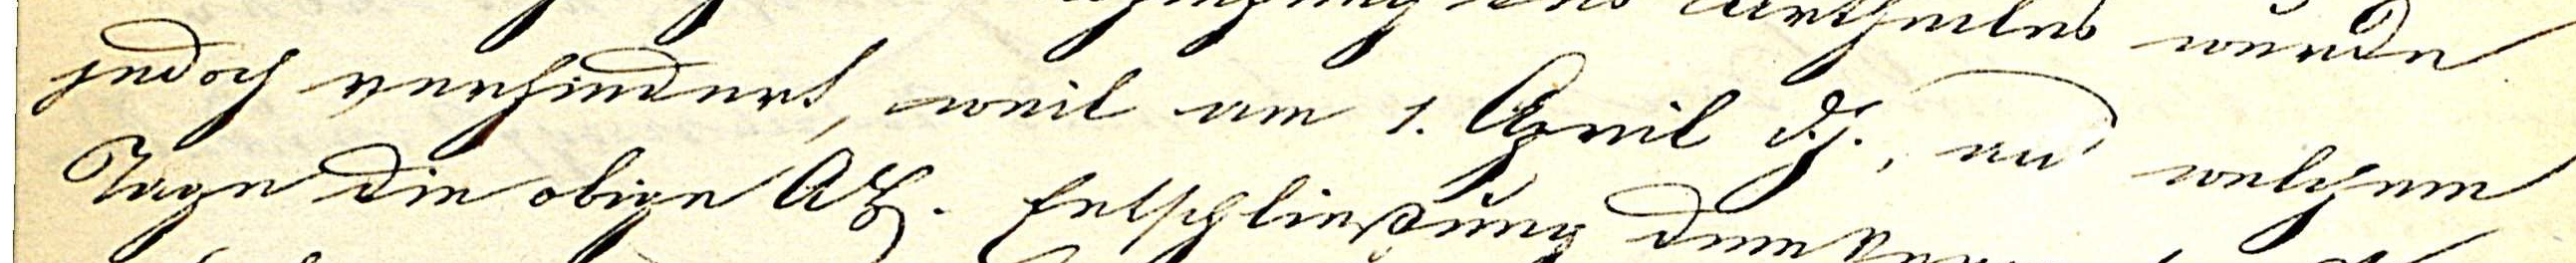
jedoch verhindert, weil am 1. April d.J. an welchem
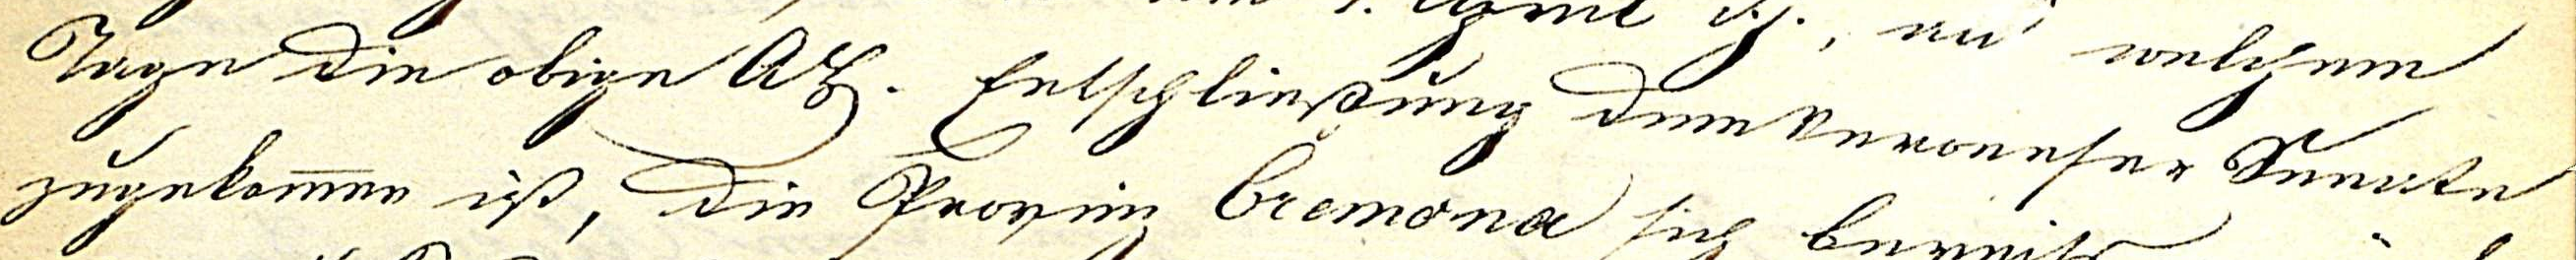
Tage die obige Ah. Entschließung dem Veroneser Senate
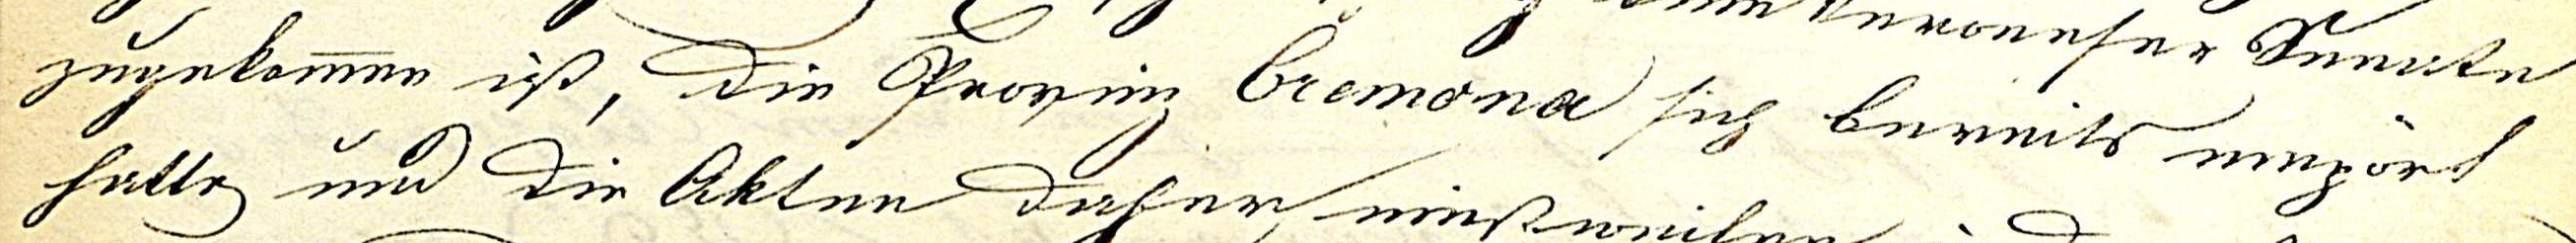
zugekommen ist, die Provinz Cremona sich bereits empört
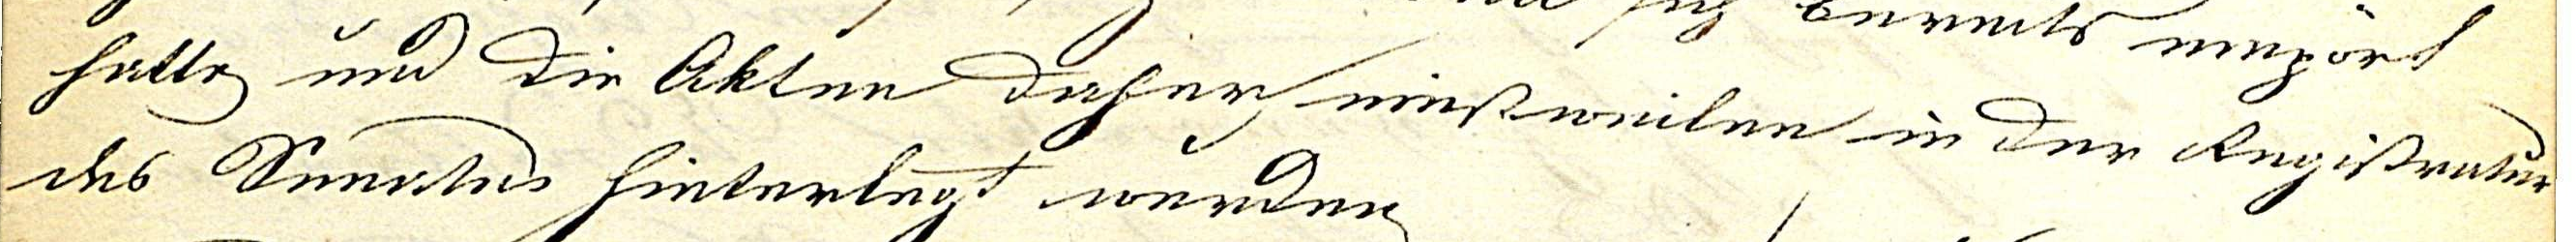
hatte und die Akten daher einstweilen in der Registratur
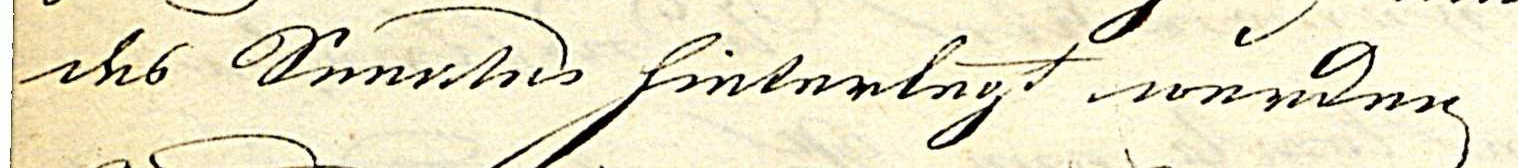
des Senates hinterlegt wurden.
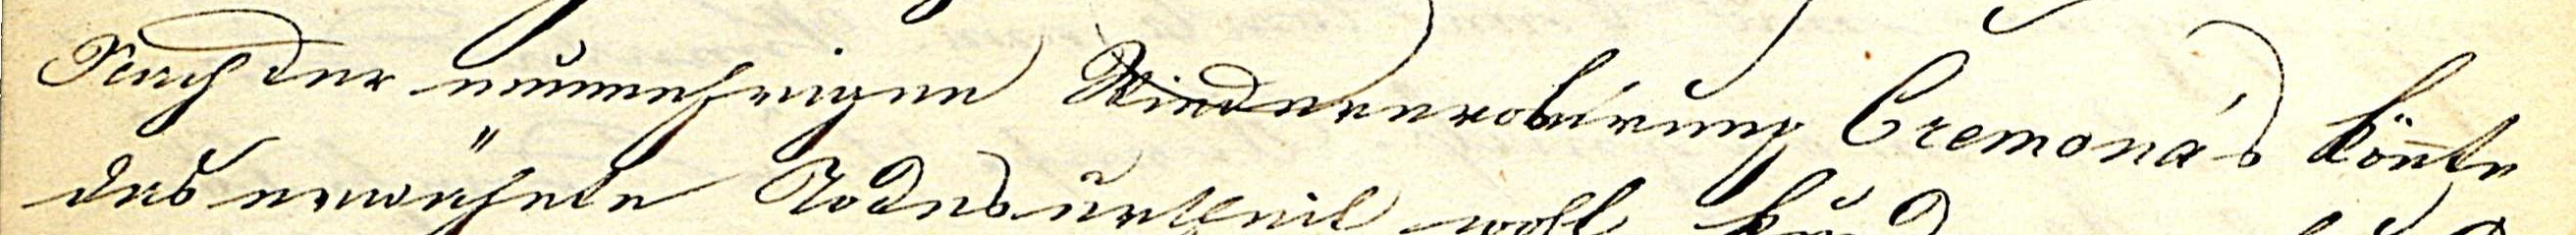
Nach der nunmehhrigen Weidererberung Cremona’s könnte
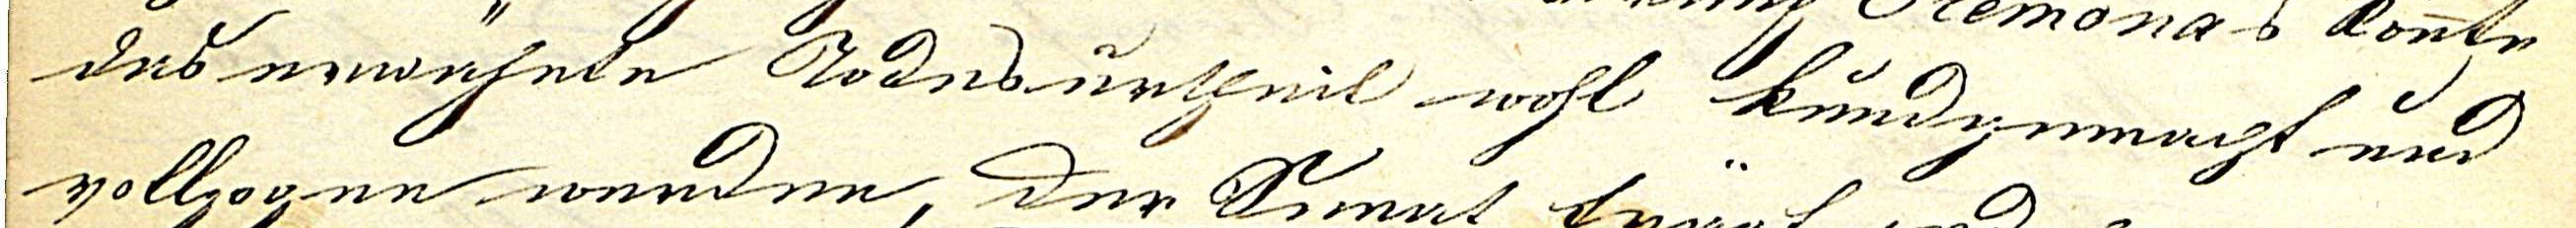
das erwähnte Todesurtheil wohl kundgemacht und
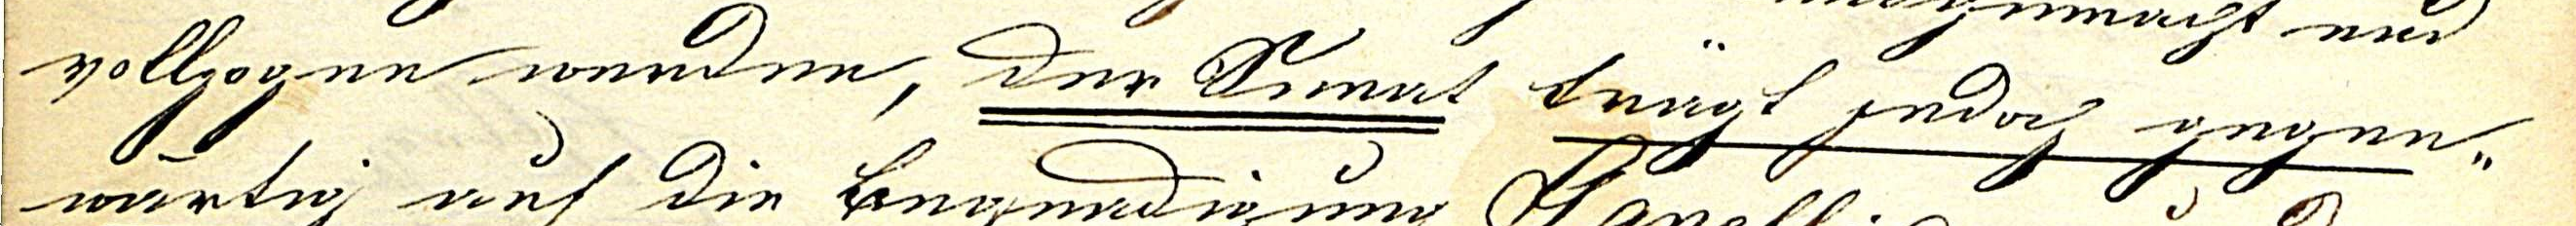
vollzogen werden, der Senat trägt jedoch gegen¬
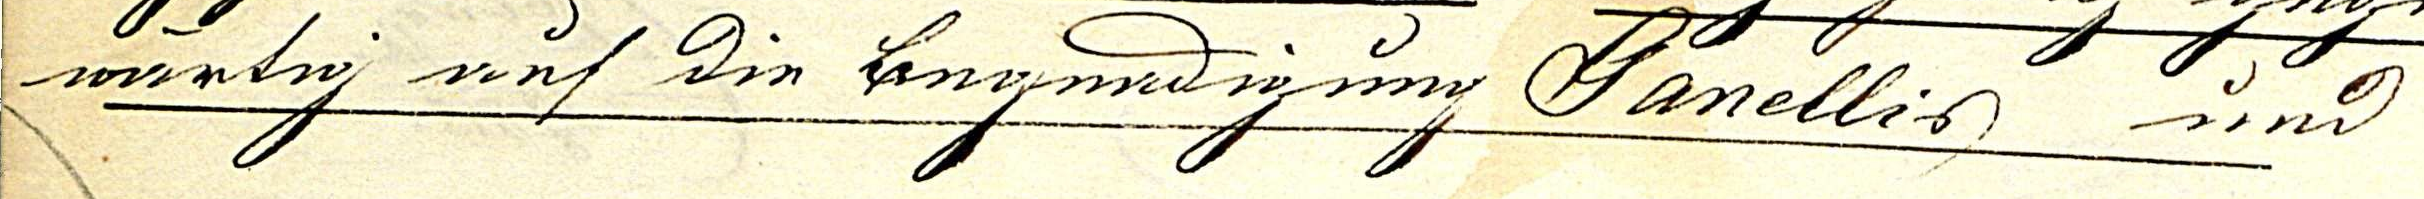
wärtig auf die Begandigung Ganellis und
